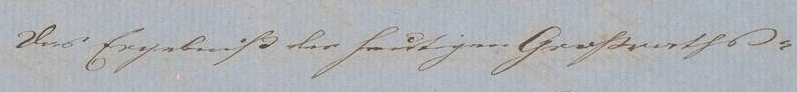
Das Ergebniß der heutigen Großraths-
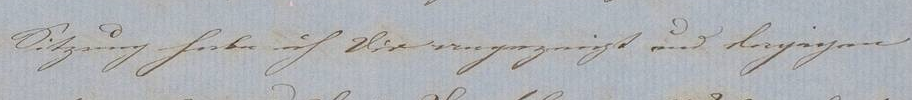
sitzung habe ich Dir angezeigt und dagegen
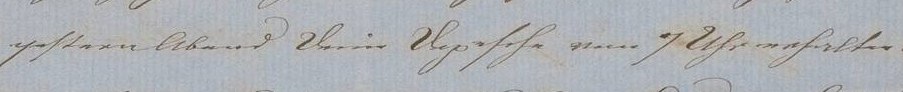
gestern Abend Deine Depesche von 7 Uhr erhalten.
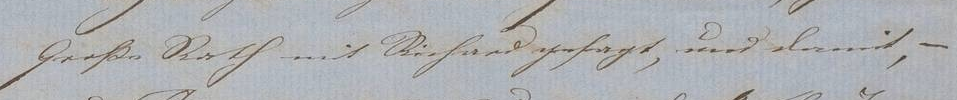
Große Rath mit Richard gesagt, und damit, –
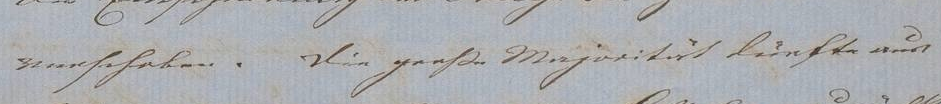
verschoben. Die große Majorität dürfte aus
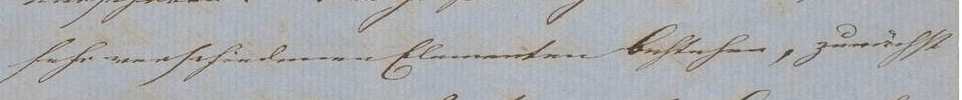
sehr verschiedenen Elementen bestehen, zunächst
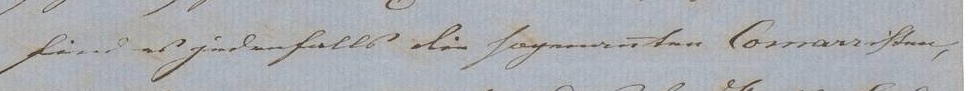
sind es jedenfalls die sogenannten Comarristen,
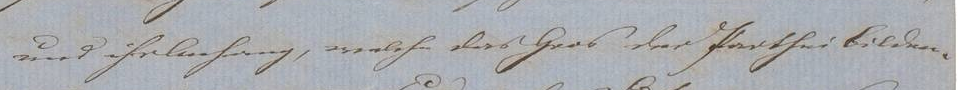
und ihr Anhang, welche das Gros der Parthei bilden.
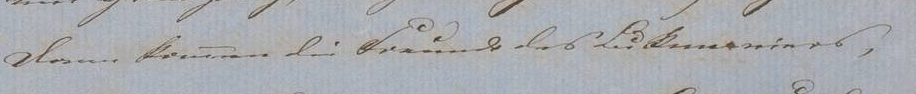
Dann kommen die Freunde des Lukmaniers,
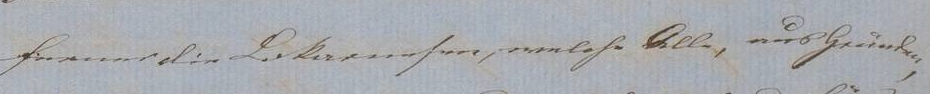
ferner die Lokarnesen, welche Alle, aus Gründen,
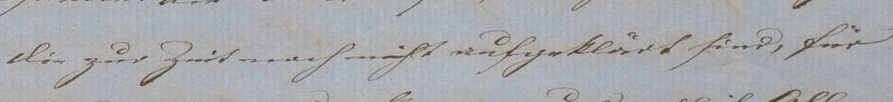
die zur Zeit noch nicht aufgeklärt sind, für
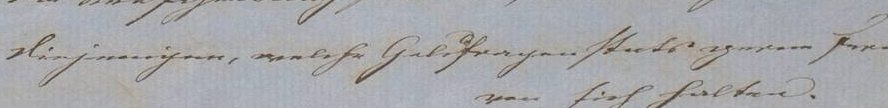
diejenigen, welche Geldfragen stets gerne fern
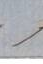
sich
